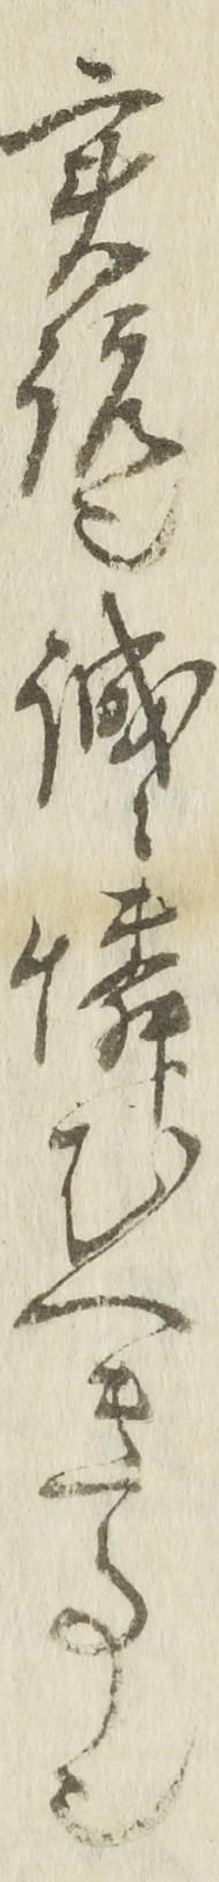実説也誠二憐むへき事也
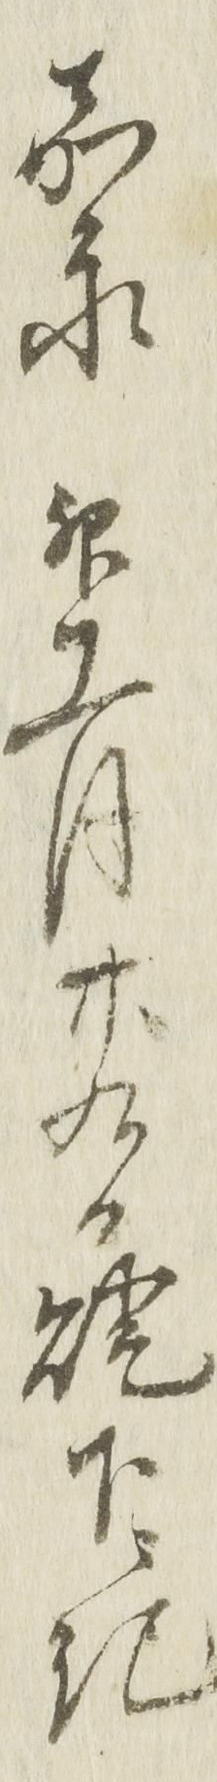嘉永卯十一月廿九日燈下ニ記
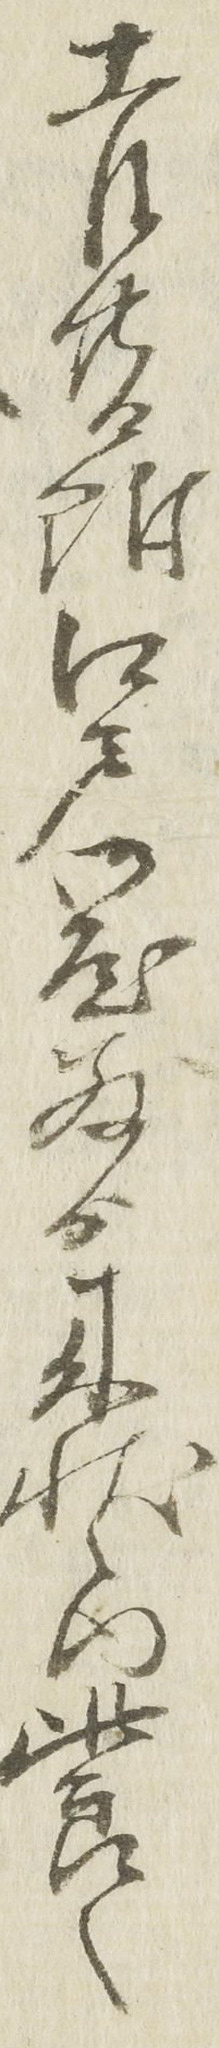十一月廿日附江戸御屋敷ゟ来状之内此節之
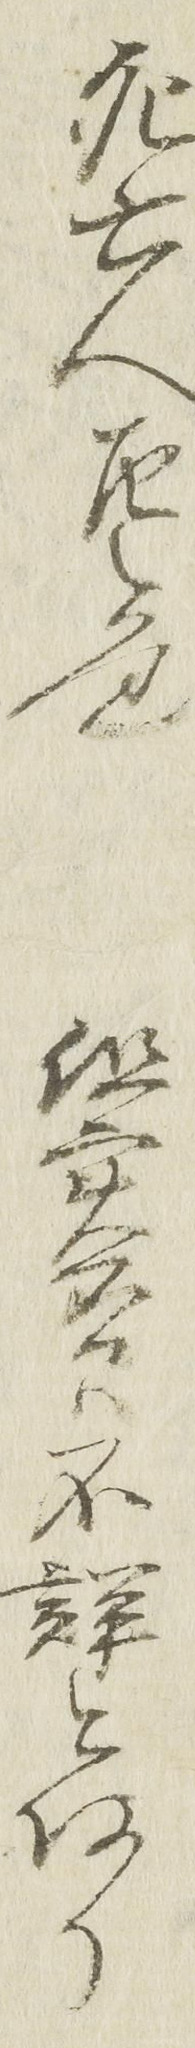死亡人左之通但実否ハ不詳とあり
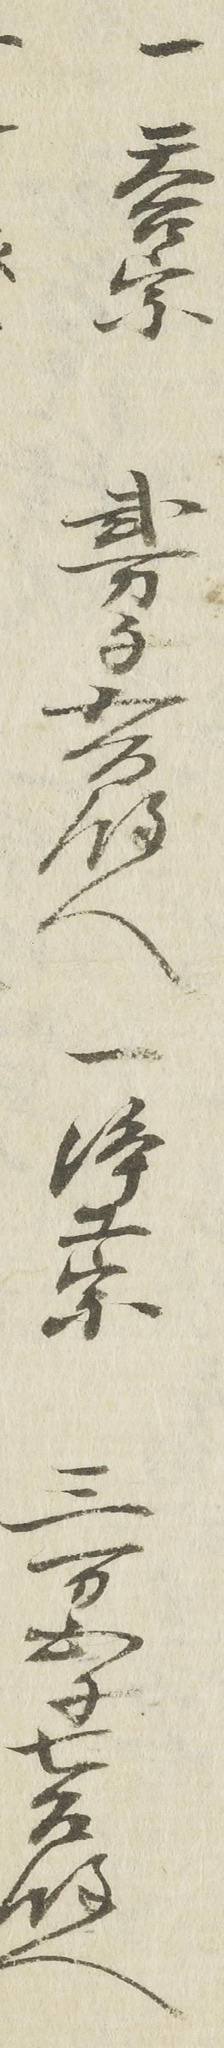一天台宗弐万千五百余人一浄土宗三万五千七百余人
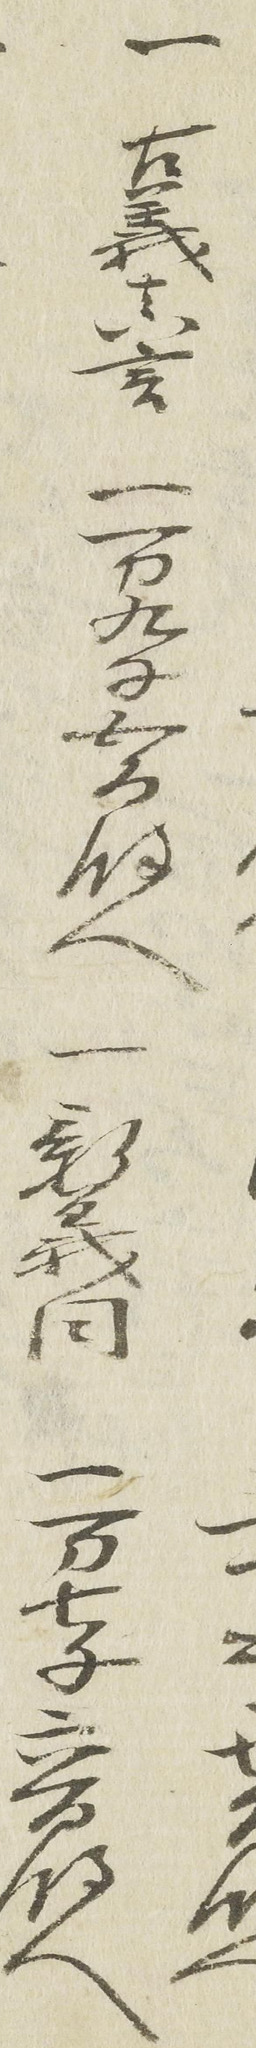一古義真言一万九千五百余人一新義同一万七千六百余人
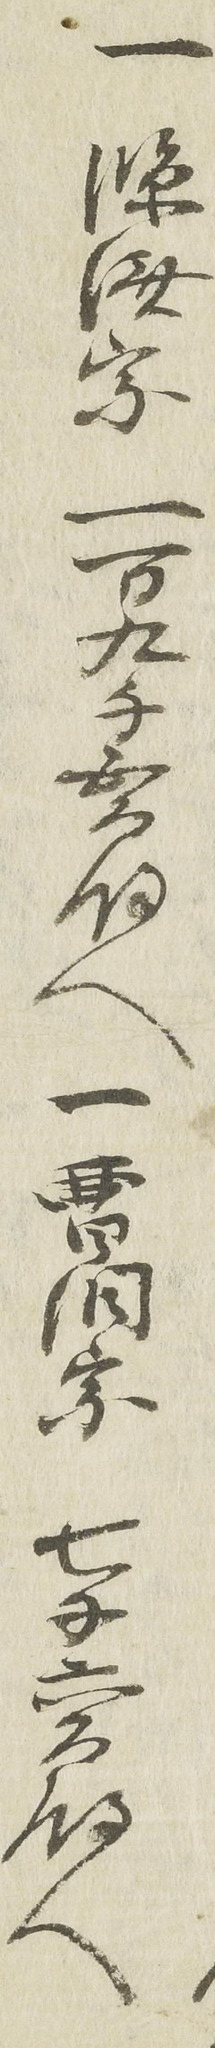一臨済宗一万九千五百余人一曹洞宗七千六百余人
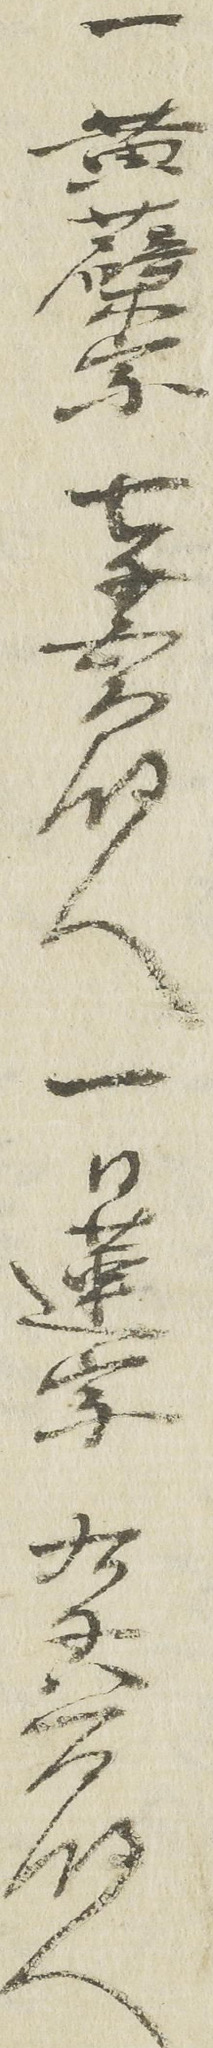一黄檗宗七千五百余人一日蓮宗九千八百余人

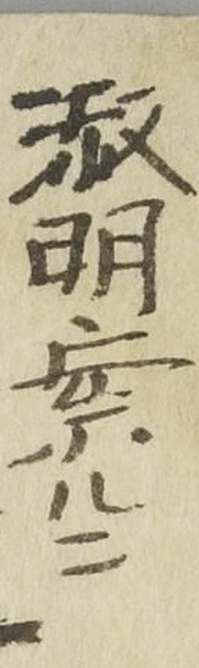淑明案ルニ
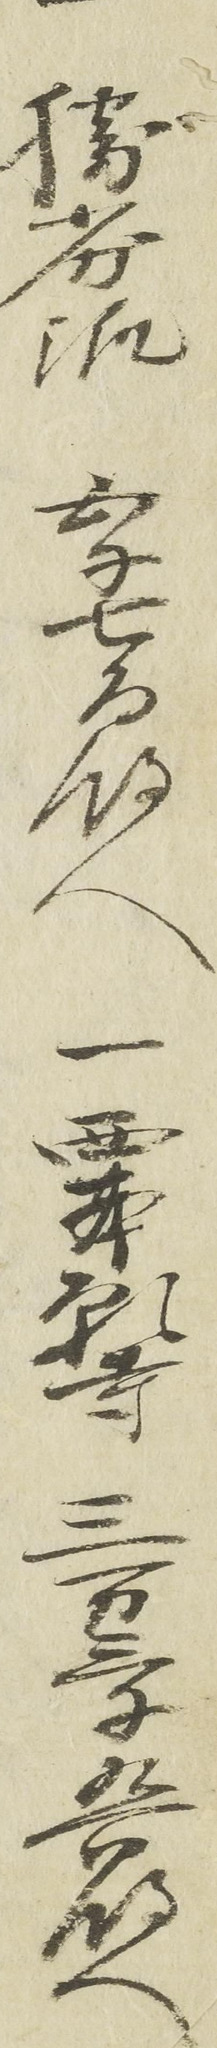一勝劣派五千七百余人一西本願寺三万三千五百余人
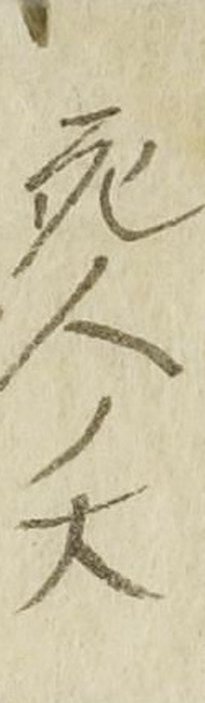死人ノ大
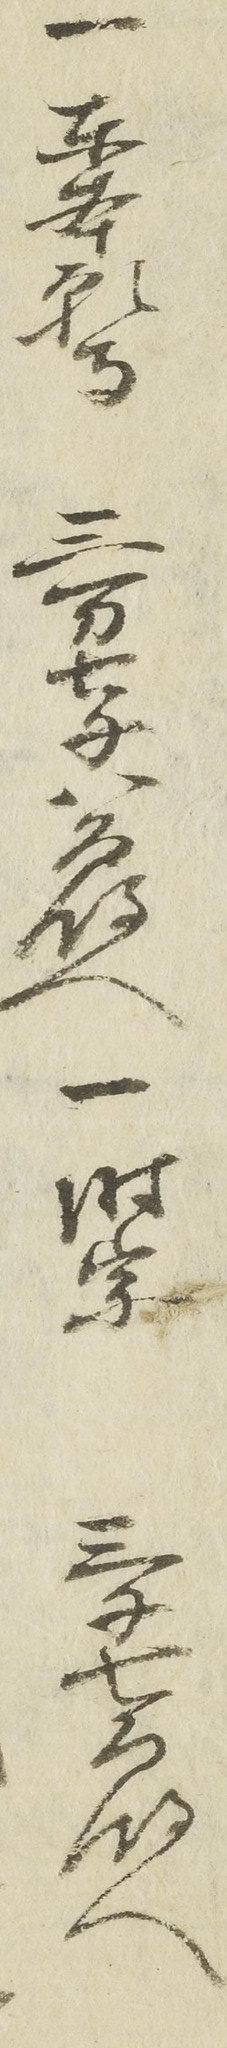一東本願寺三万七千八百余人一時宗三千七百余人
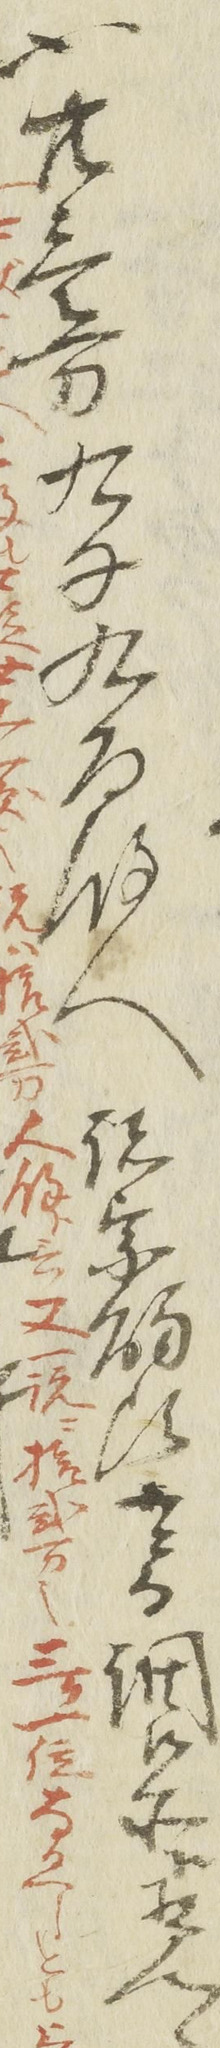〆廿壱万九千九百余人諸宗触頭ニ而調候所エ有之候
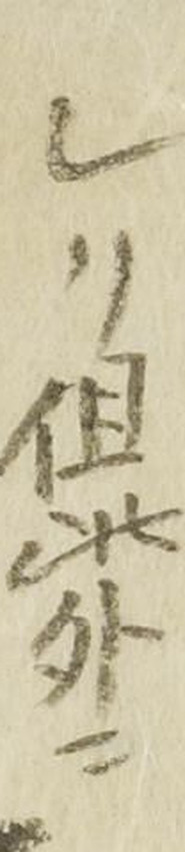レリ但此外二
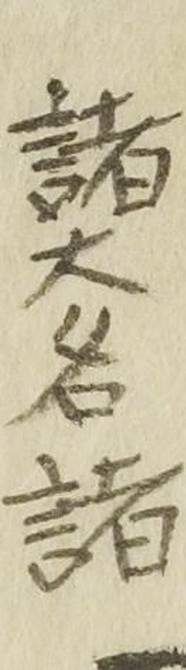諸大名諸
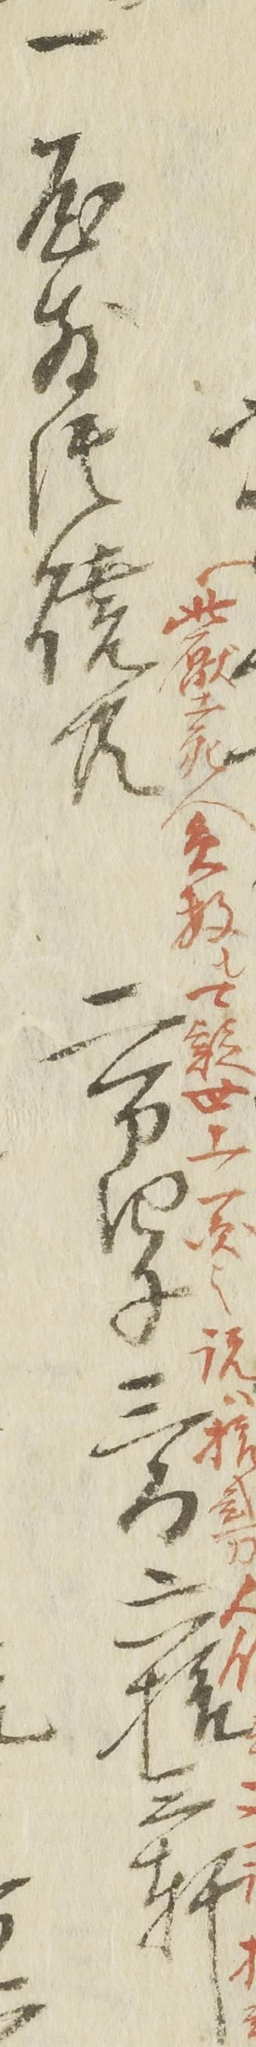一屋敷潰焼共二万四千三百六拾三軒
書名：安政乙卯江戸大地震筆記　安政丙辰八月大阪大雷雨之記追加　安政三辰年七月松前辺大地震并八月大風雨記録
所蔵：東京大学地震研究所図書室 Earthquake Research Institute Library, The University of Tokyo, JAPAN
